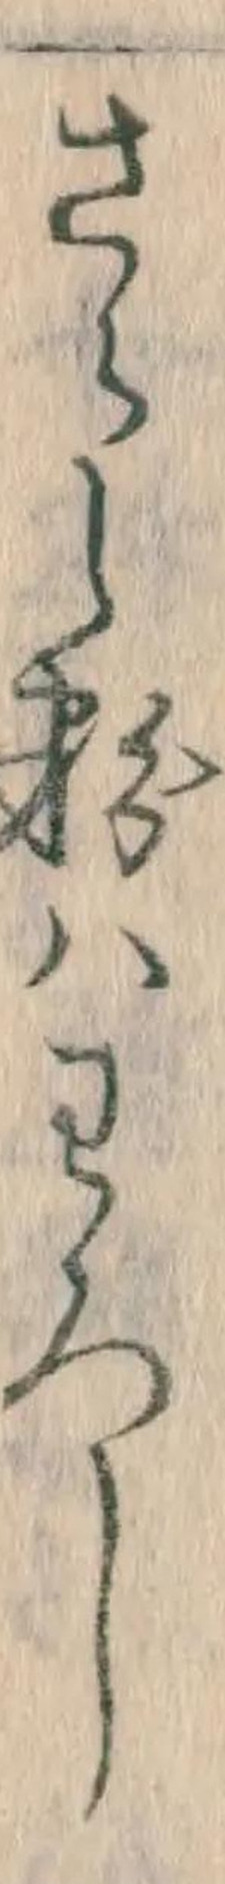さらし粉はわろし
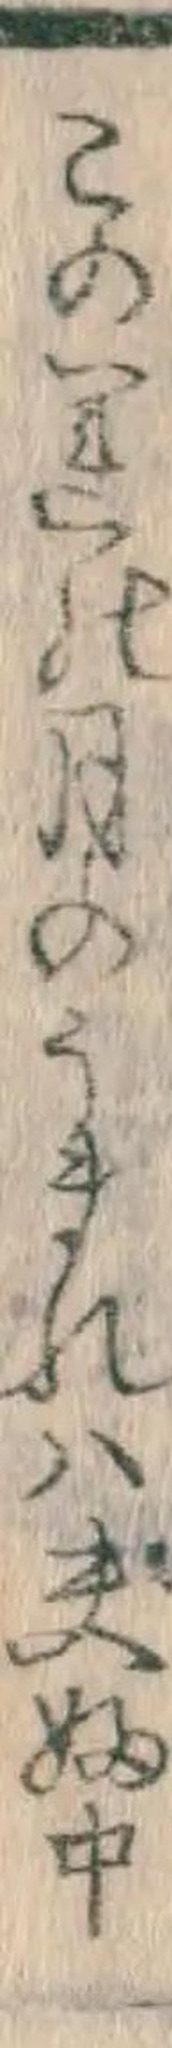この運の月のうまれは夫婦中
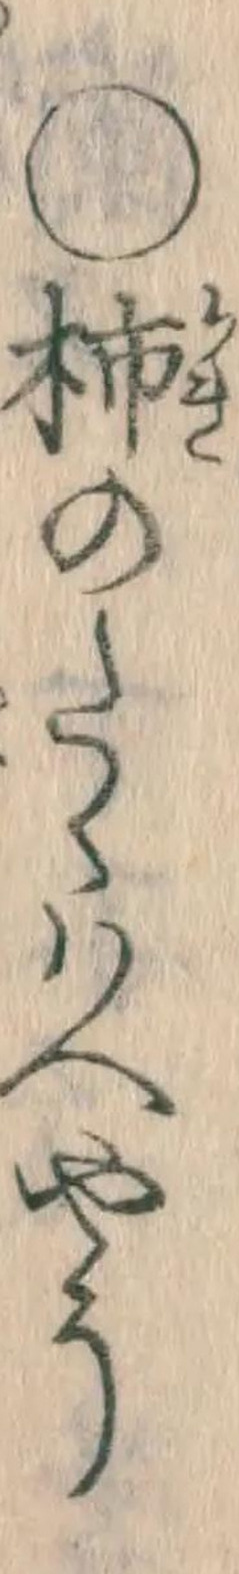○柿のたくはへやう
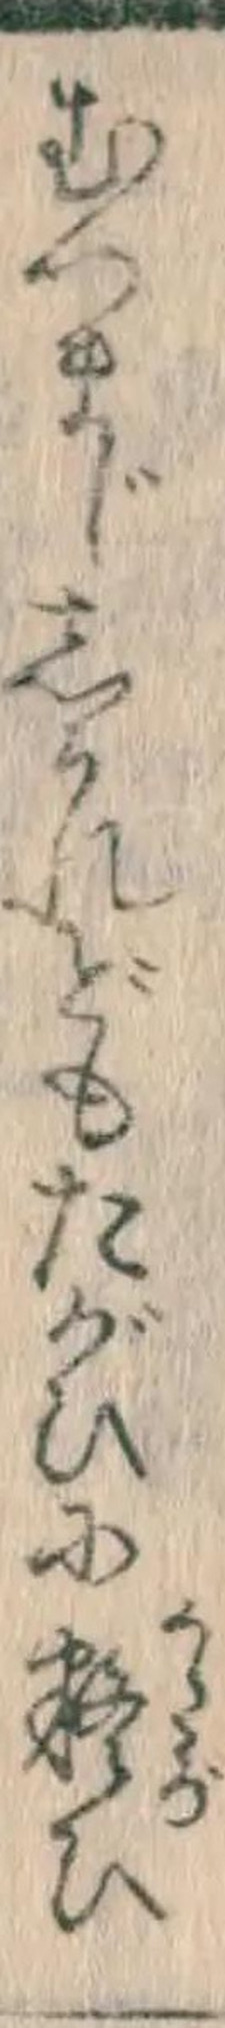むつまじしかれどもたがひに疑ひ
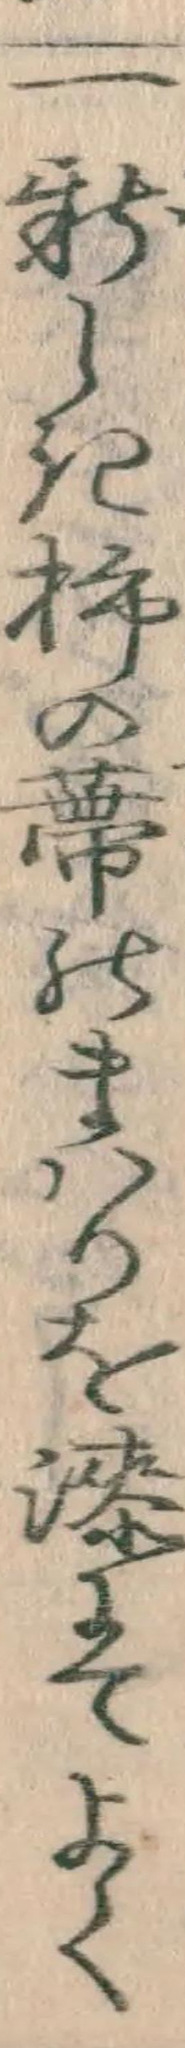一新しき柿の蔕のまはりを漆にてよく
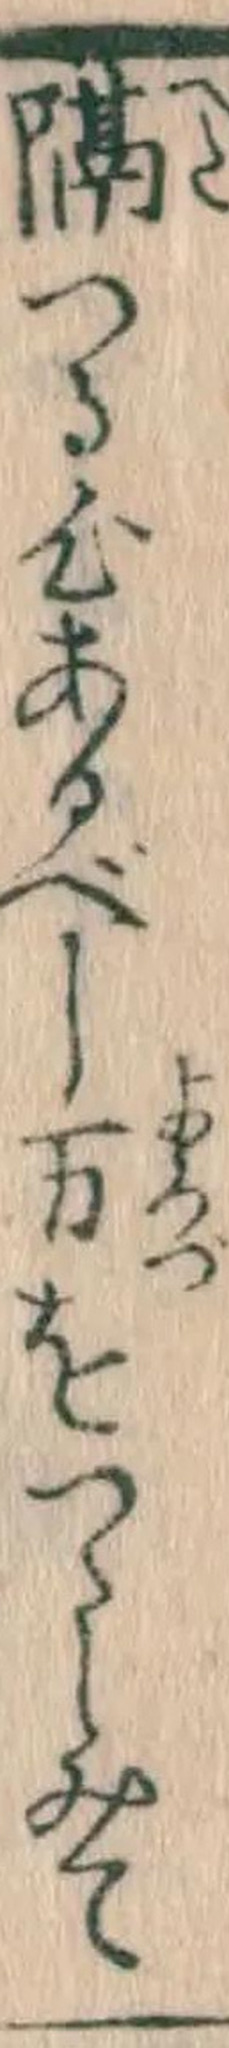隔つる心あるべし万をつゝしみて
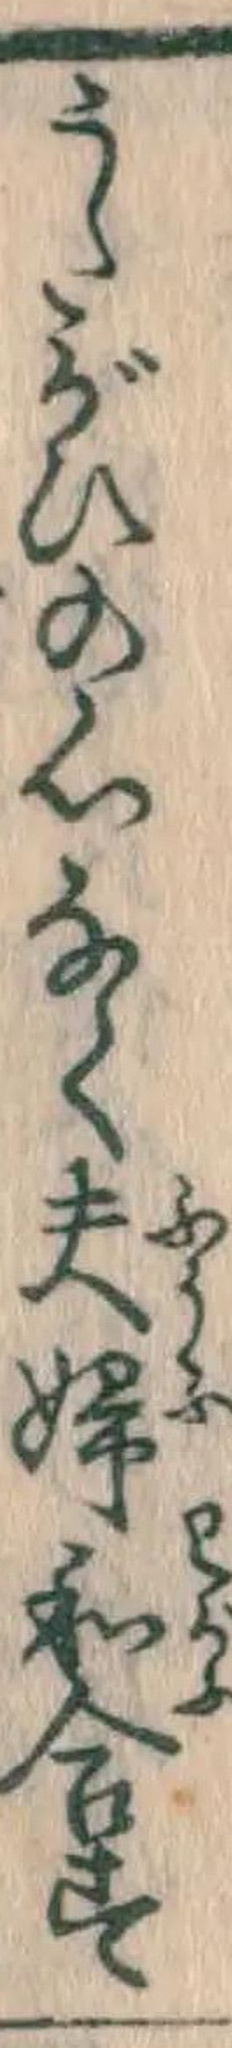うたがひの心なく夫婦和合す
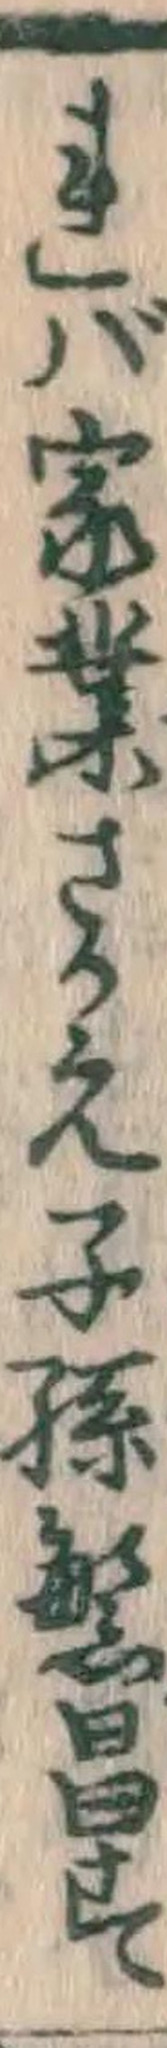れば家業さかえ子孫繁昌す
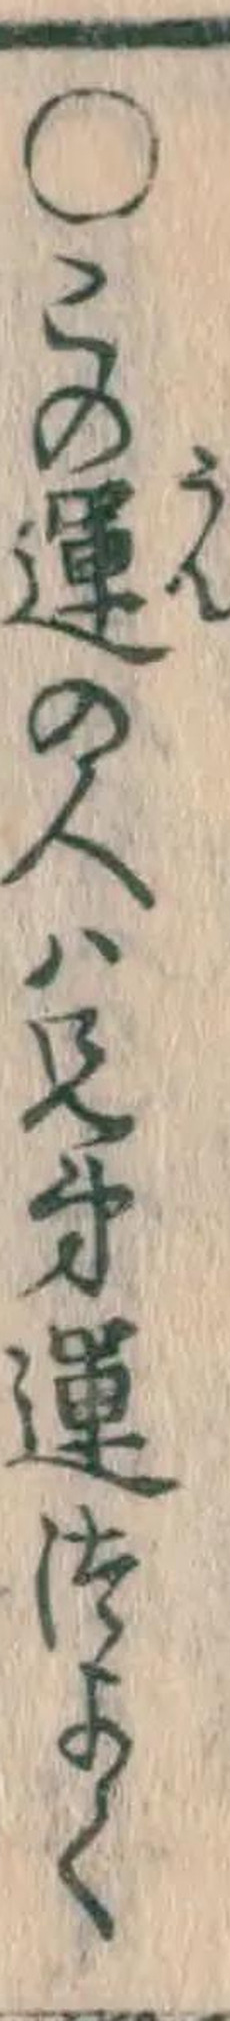○この運の人は兄弟運つよく
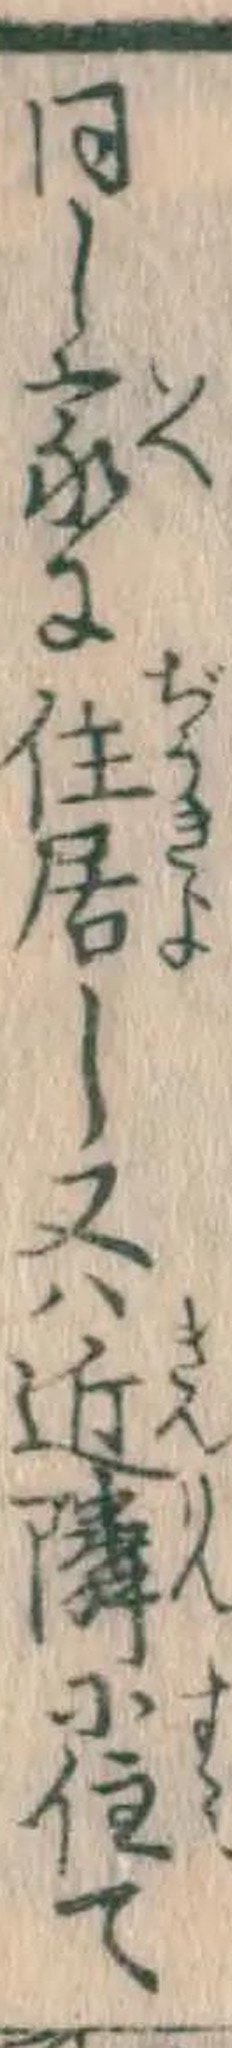同し家に住居し又は近隣に住て
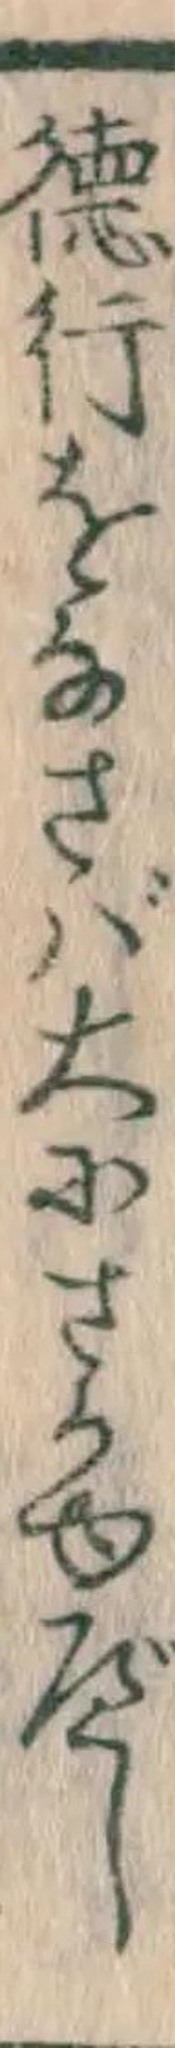徳行をなさば大にさかゆべし
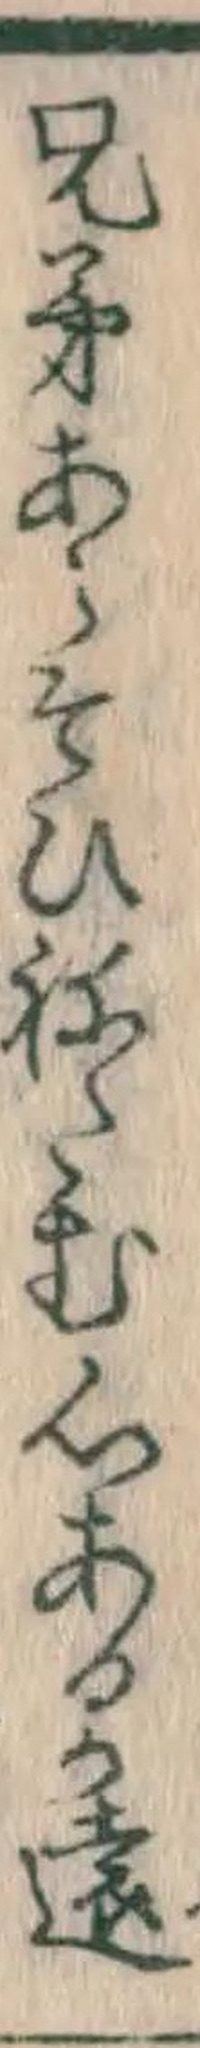兄弟あらそひねたむ心あるか遠
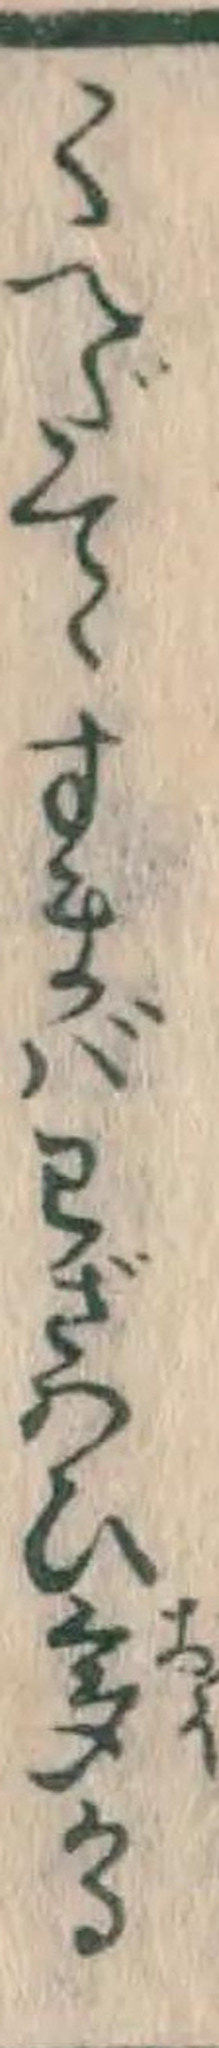くへだてゝすまばわざはひ多かる
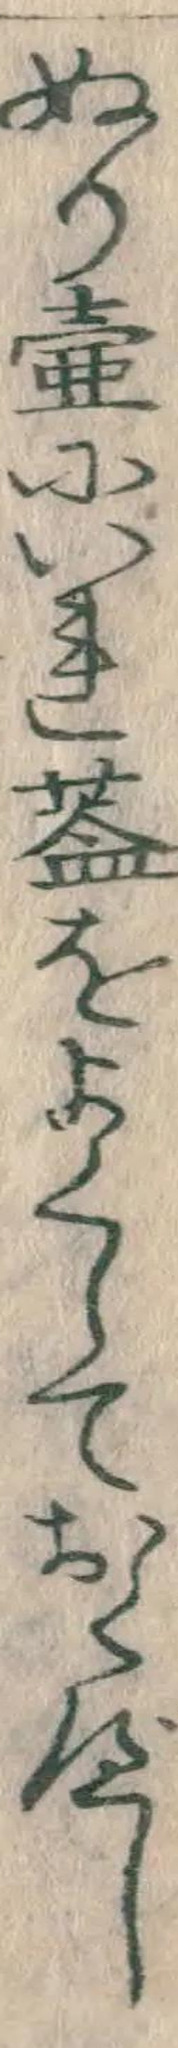ぬり壺にいれ葢をよくしておくべし
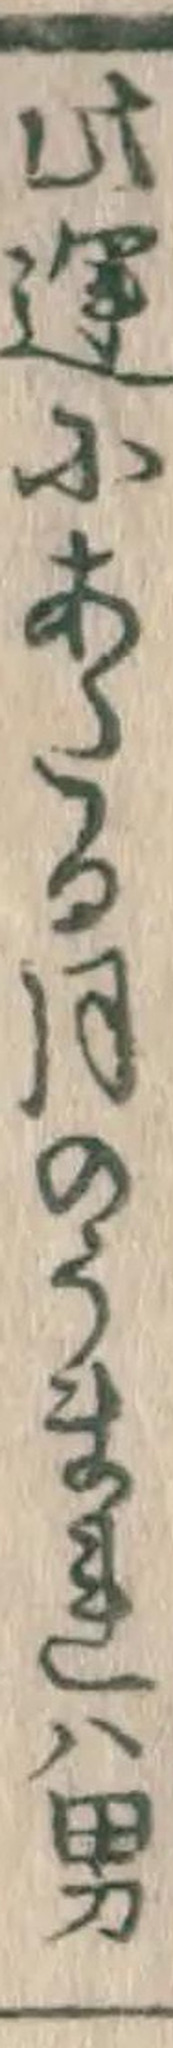此運にあたる月のうまれは男
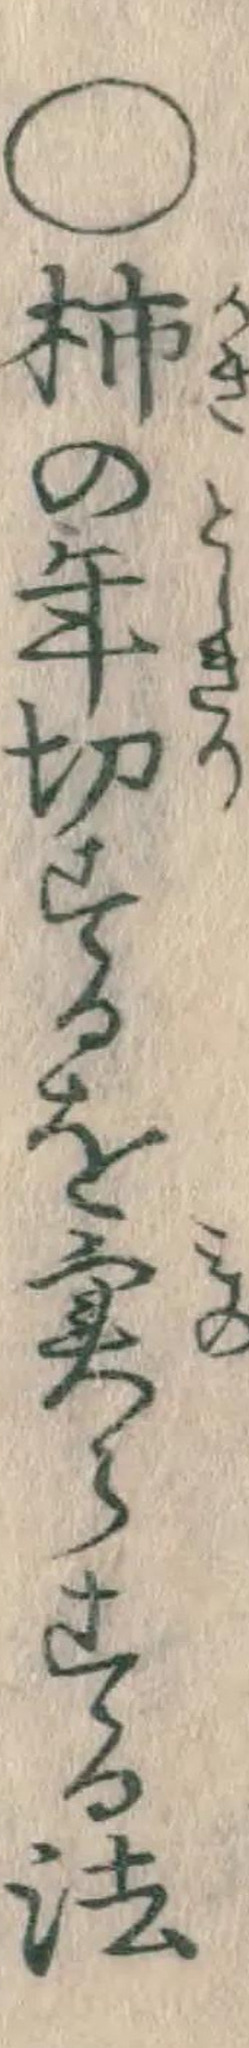○柿の年切するを実らする法
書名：広益秘事大全 3巻. [2]
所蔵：国立国会図書館 National Diet Library, JAPAN
